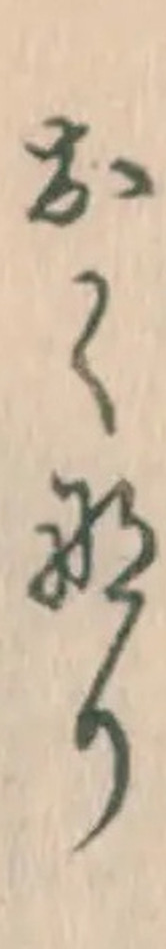おくなり
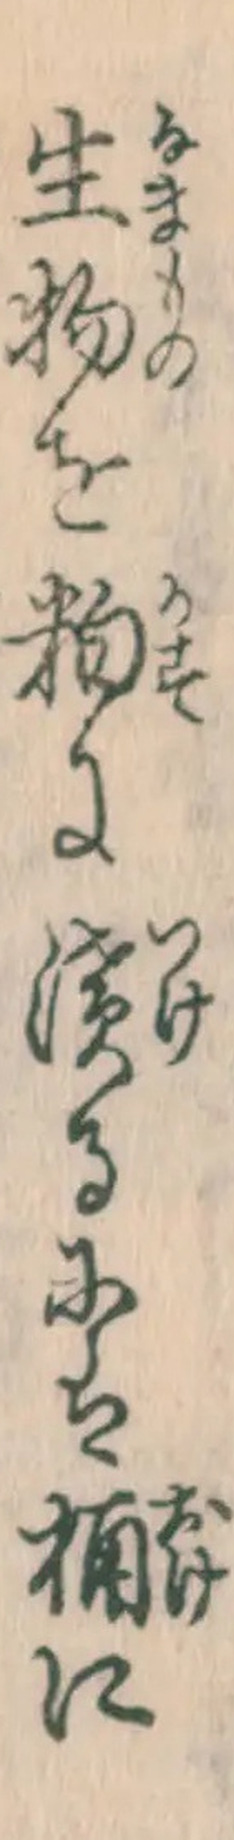生物を粕に漬るには桶に
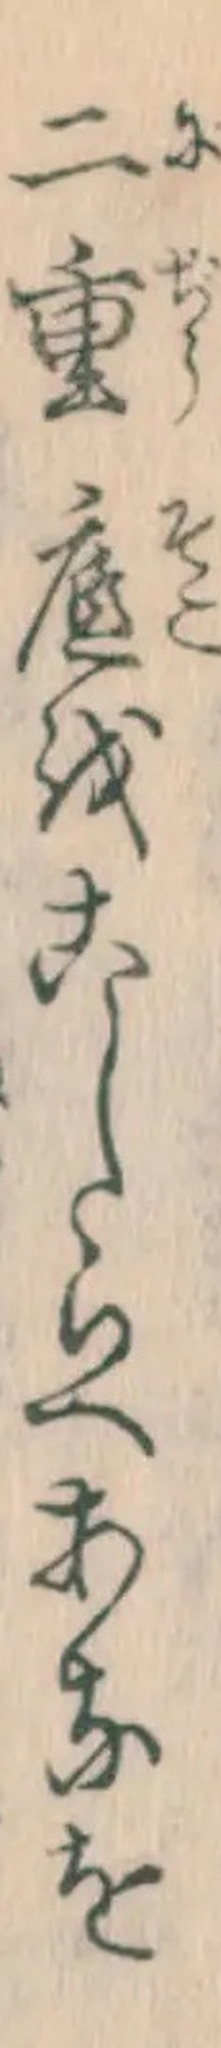二重底をこしらへあなを
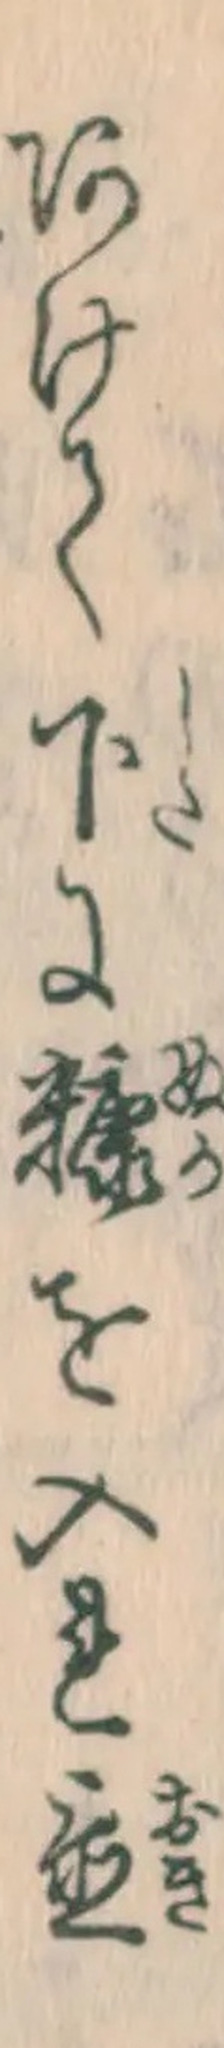あけて下に糠をいれ置
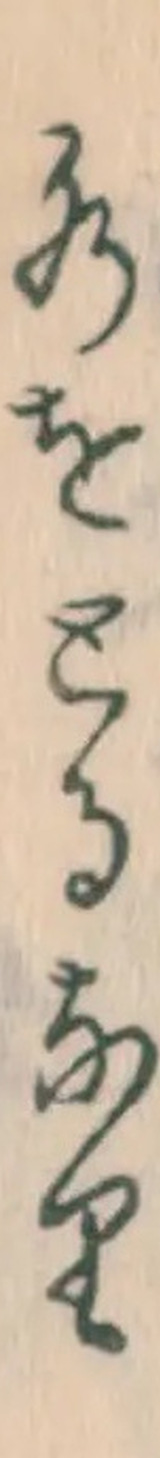水をとるなり
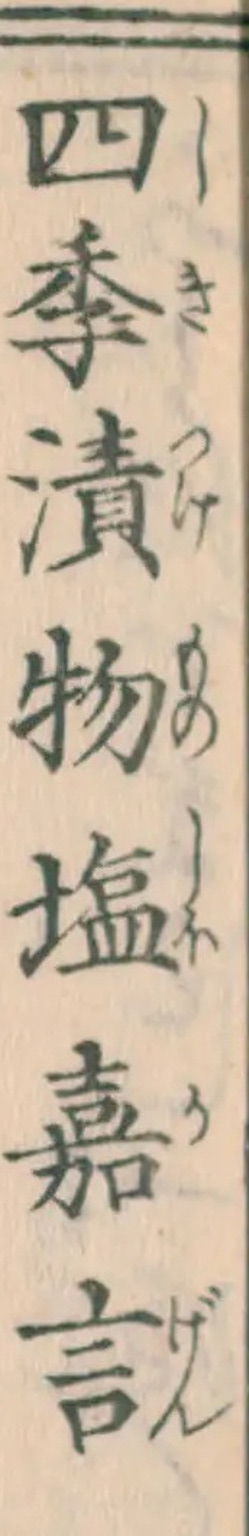四季漬物塩嘉言
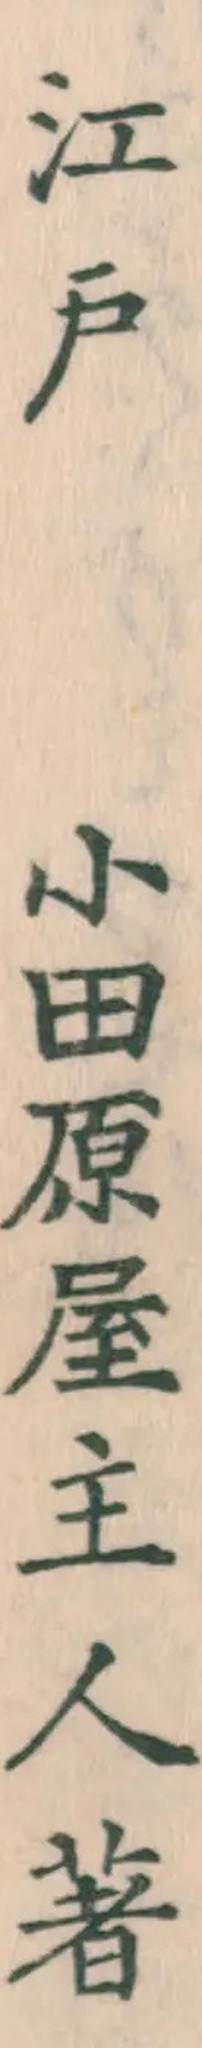江戸小田原屋主人著
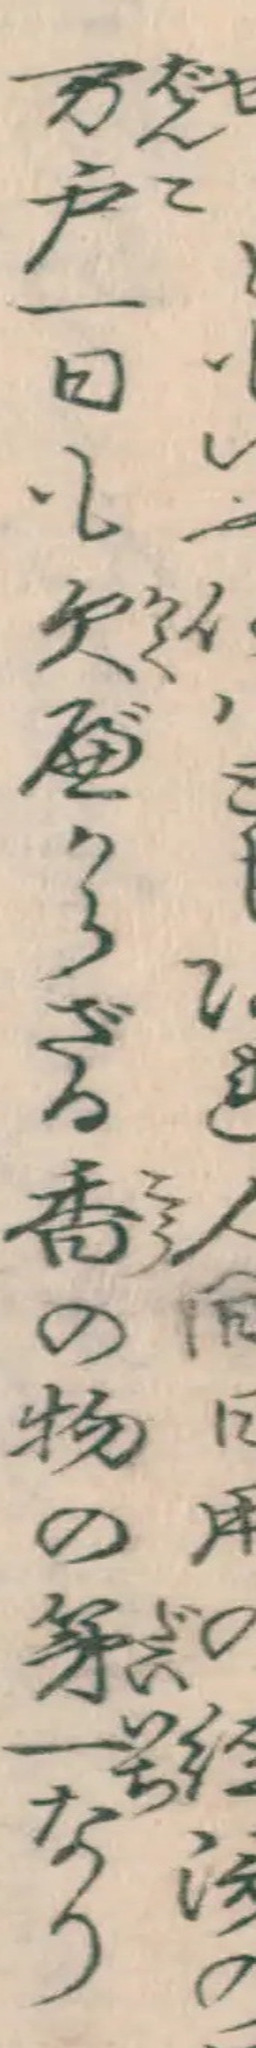万戸一日も欠べからざる香の物の第一なり
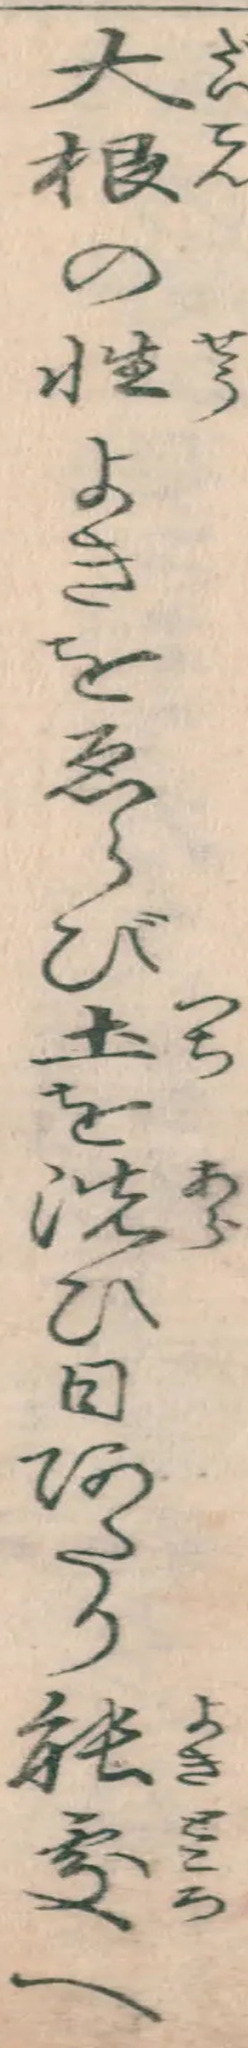大根の性よきをゑらび土を洗ひ日あたり能処へ
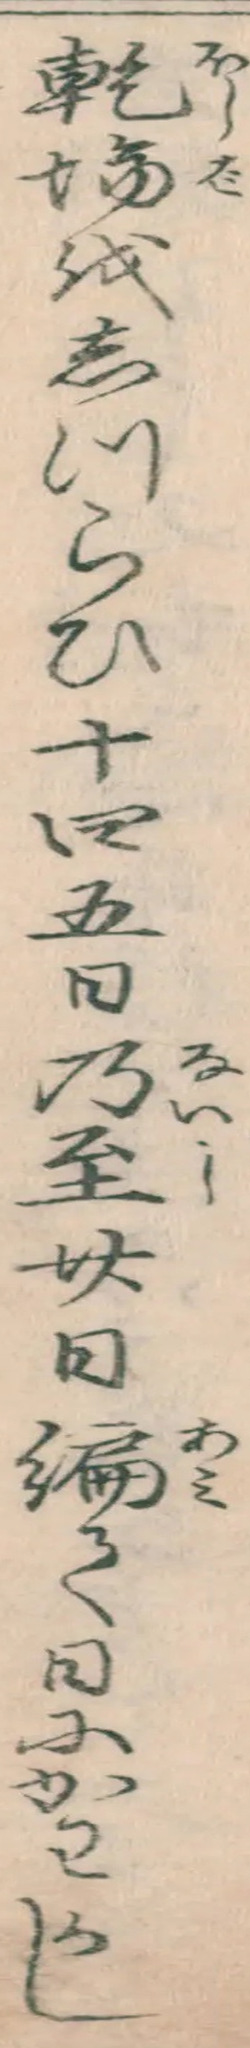乾場をしつらひ十四五日乃至廿日編て日にかわかし
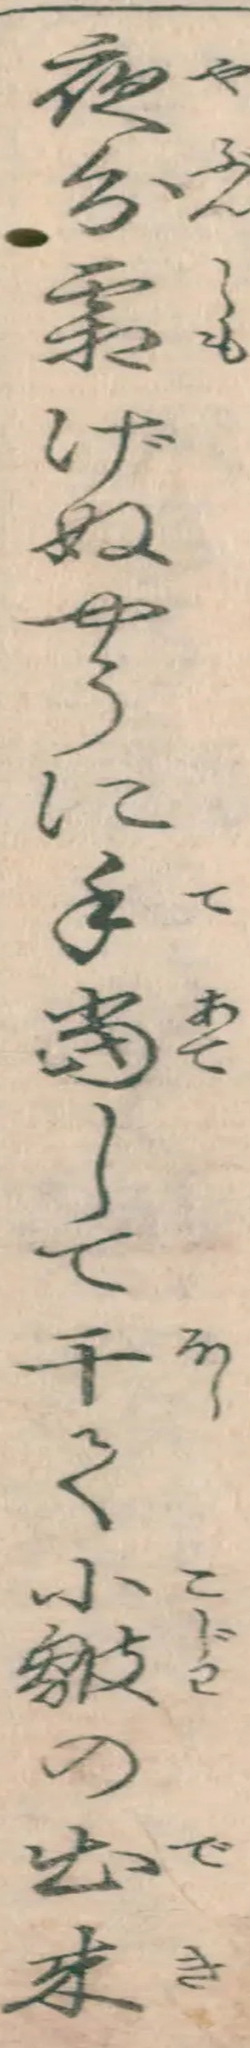夜分霜げぬやうに手当して干て小皺の出来

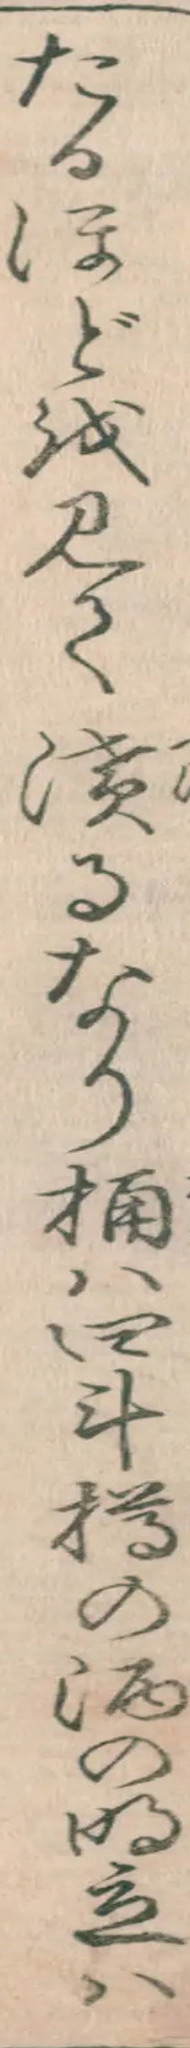たるほどを見て漬るなり桶は四斗樽の酒明立は
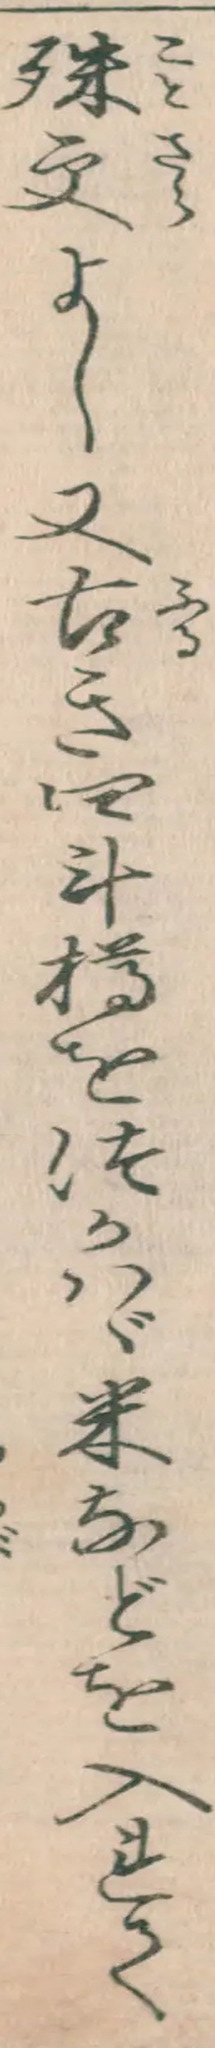殊更よし又古き四斗樽をつかはゞ米などを入れて
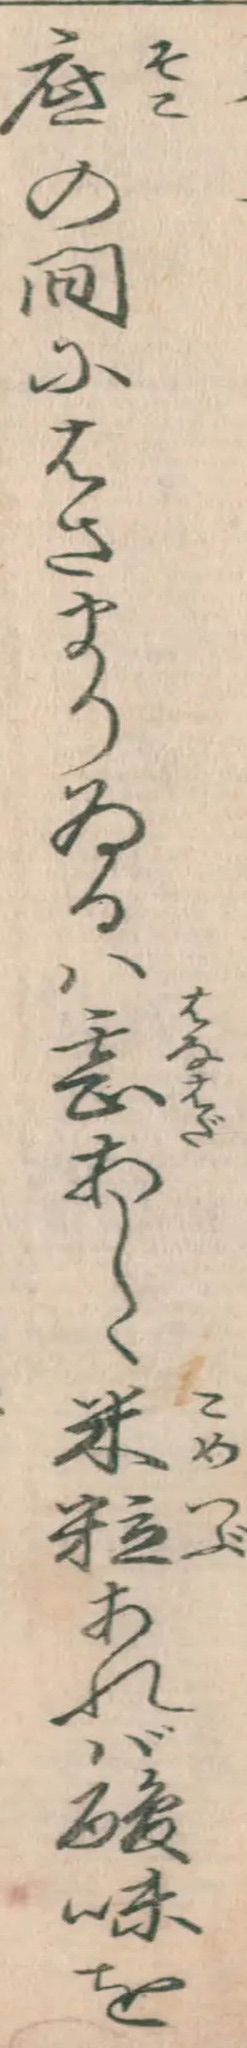底の間にはさまりゐるは甚あしく米粒あれば酸味を
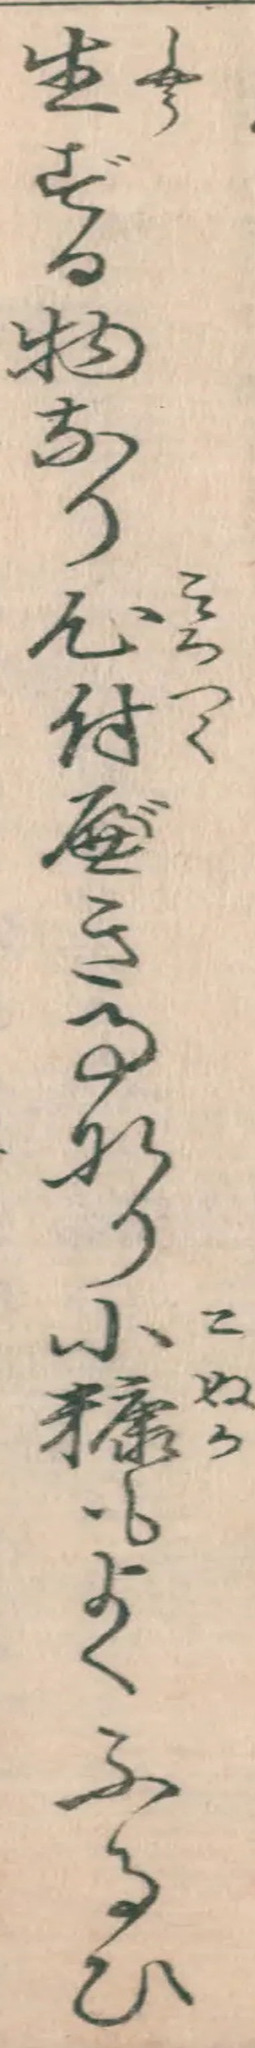生ずる物なり心付べき事なり小糠もよくふるひ
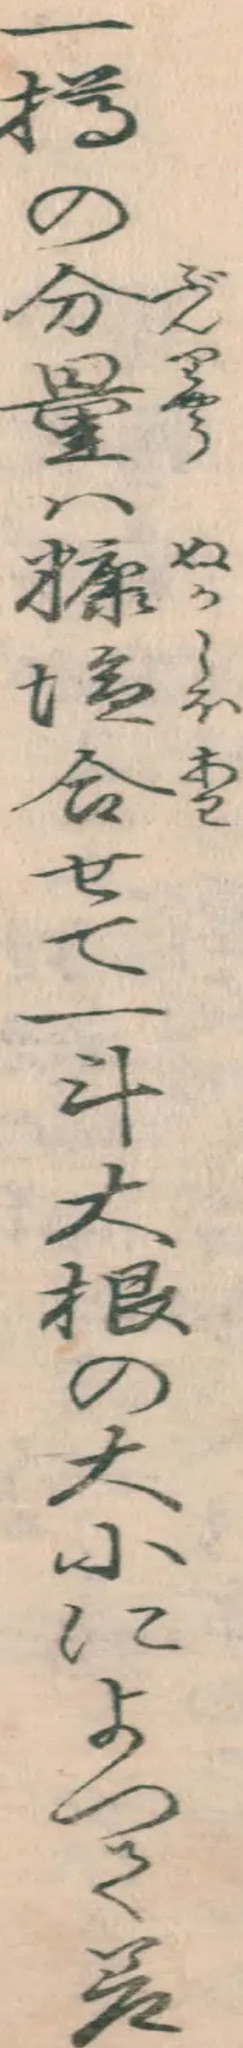一樽の分量は糠塩合せて一斗大根の大小によつて差
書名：四季漬物鹽嘉言
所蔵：国立国会図書館 National Diet Library, JAPAN
